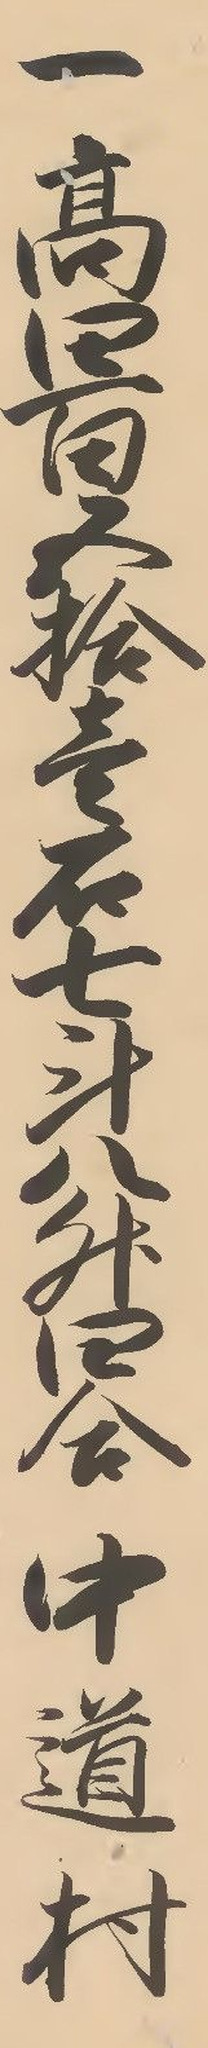一高四百五拾壱石七斗八升四合中道村
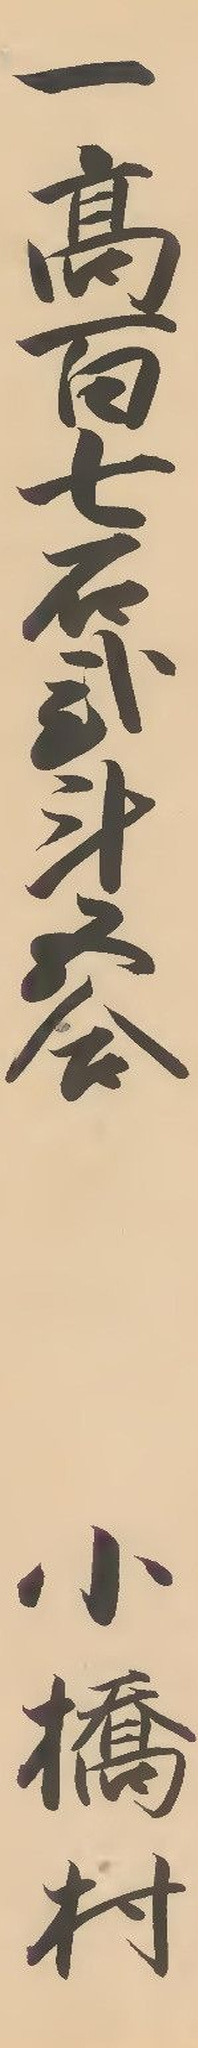一高百七石弐斗五合小橋村

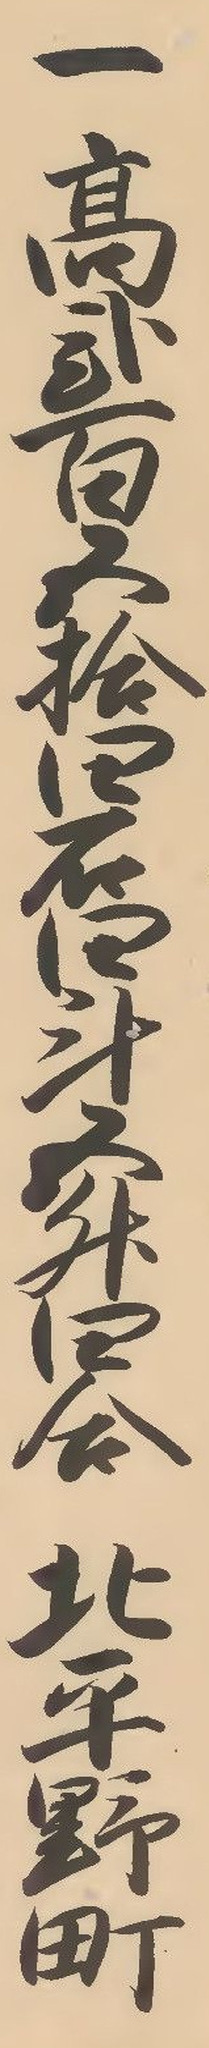一高弐百五拾四石四斗五升四合北平野町
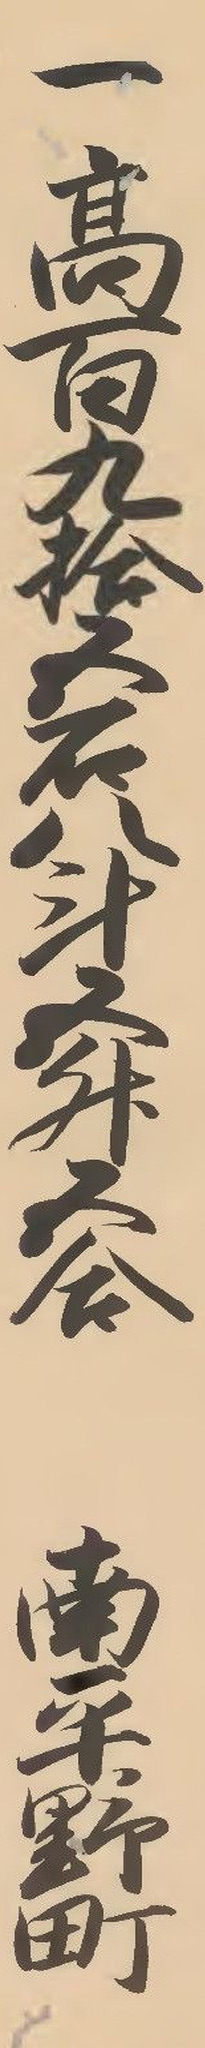一高百九拾五石八斗五升五合南平野町
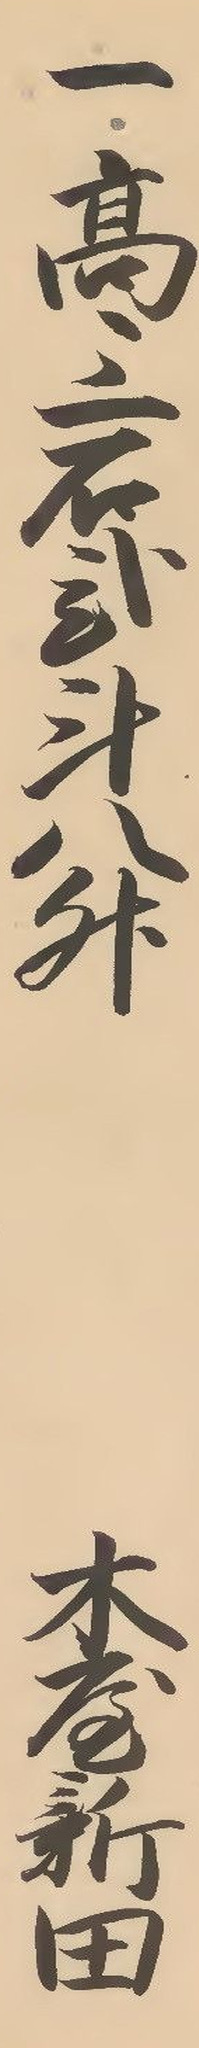一高三石弐斗八升木屋新田
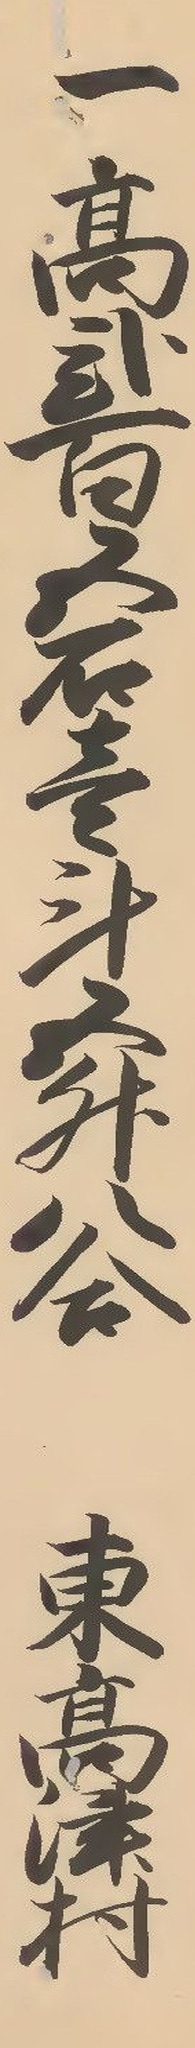一高弐百五石壱斗五升八合東高津村
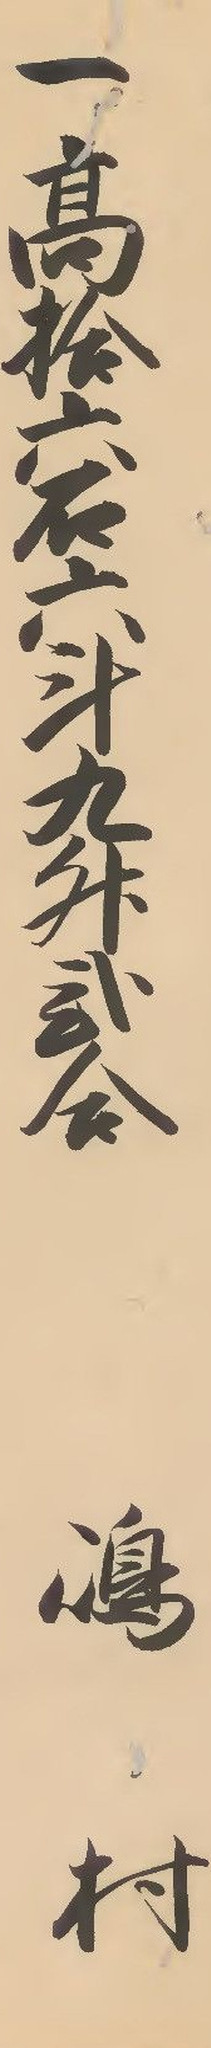一高拾六石六斗九升弐合島村
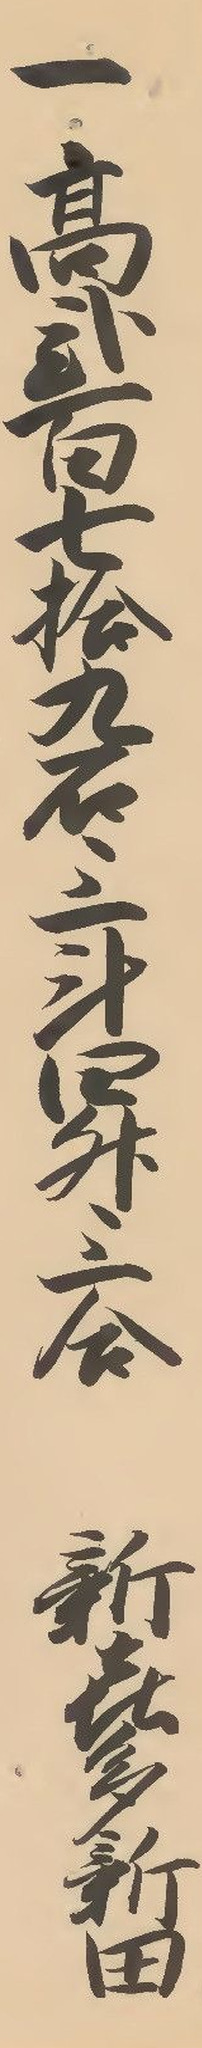一高弐百七拾九石三斗四升三合新喜多新田
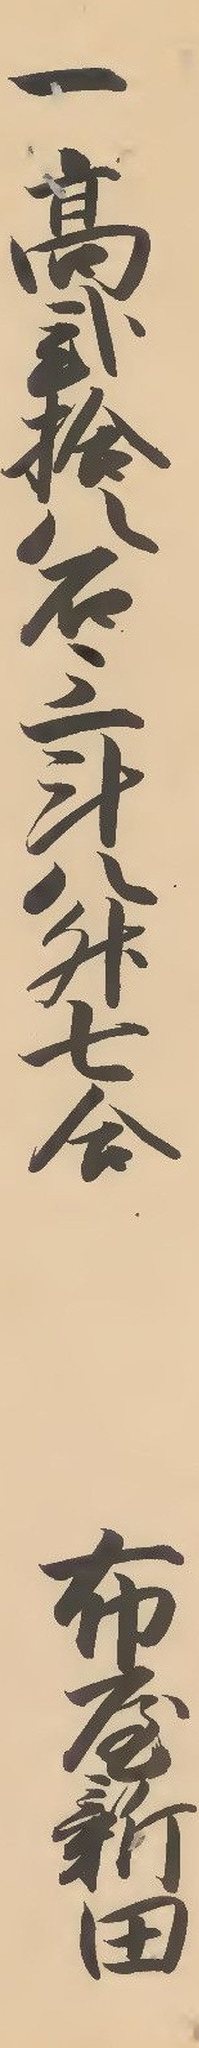一高弐拾八石三斗八升七合布屋新田
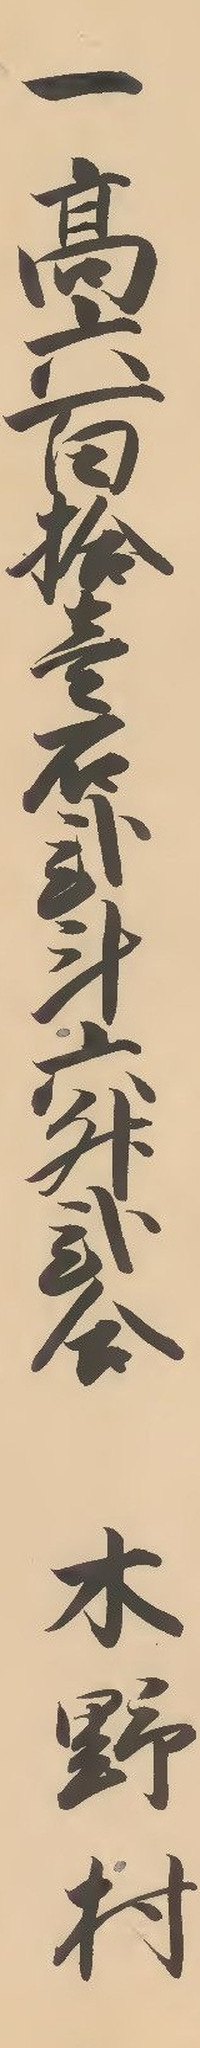一高六百拾壱石弐斗六升弐合木野村

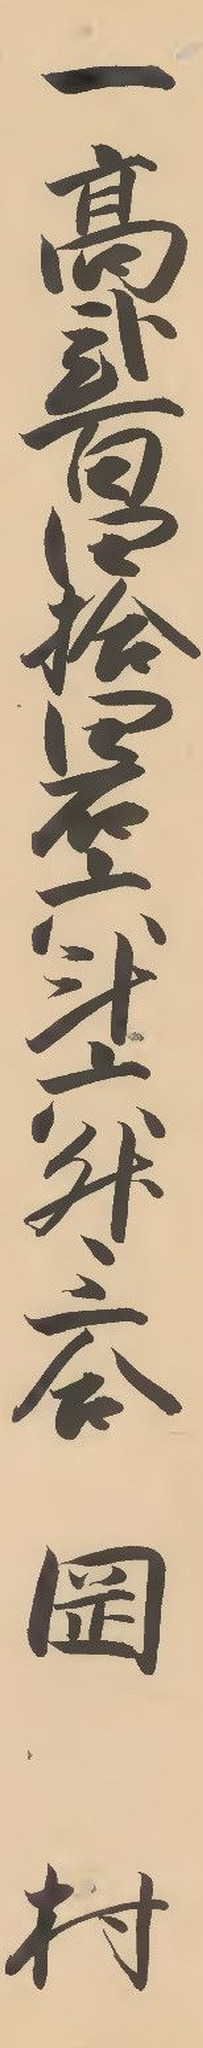一高弐百四拾四石六斗六升三合岡村
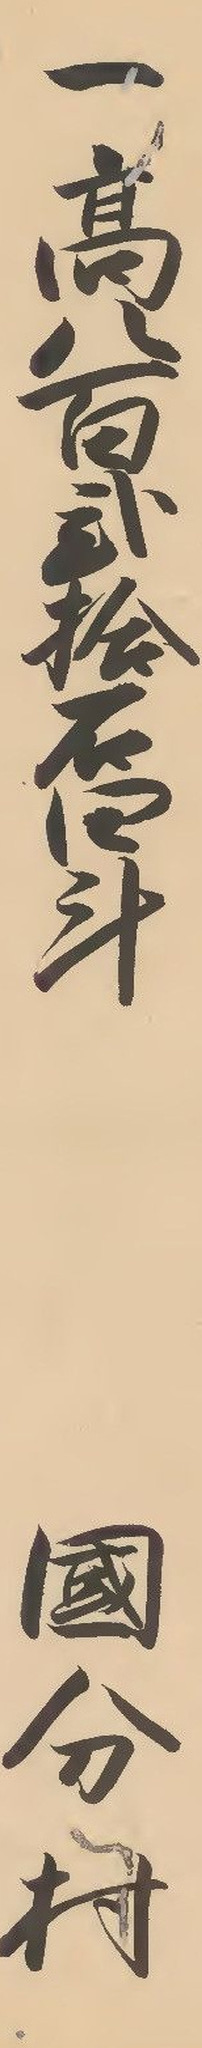一高八百弐拾石四斗国分村
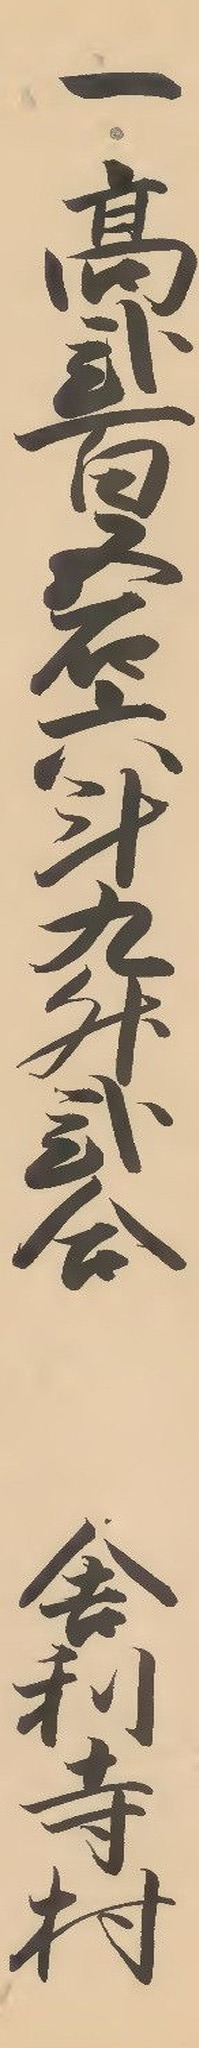一高弐百五石六斗九升弐合舎利寺村
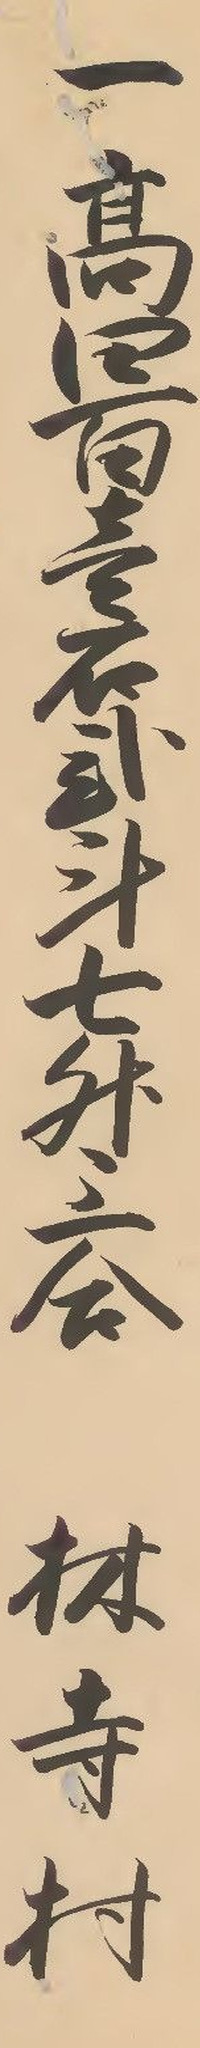一高四百壱石弐斗七升三合林寺村
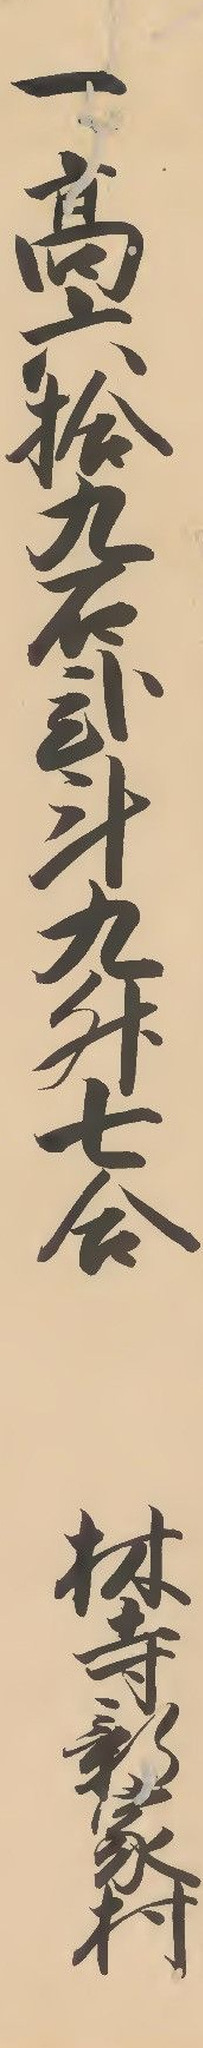一高六拾九石弐斗九升七合林寺新家村
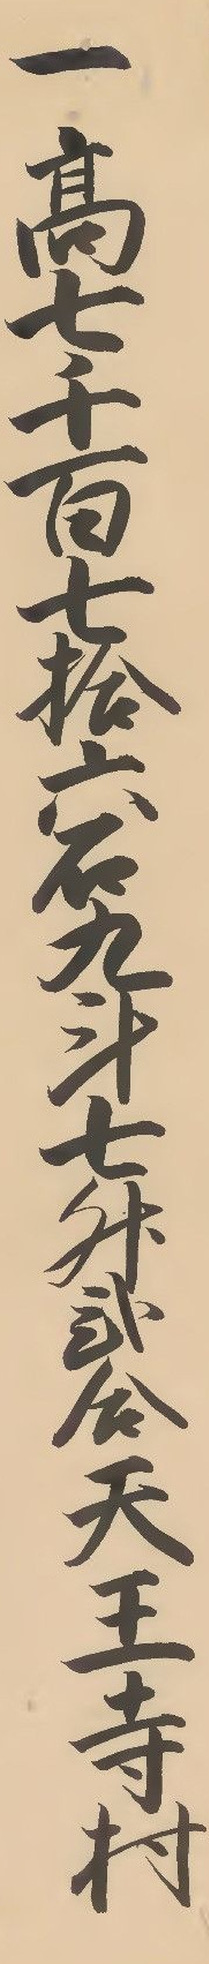一高七千百七拾六石九斗七升弐合天王寺村
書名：摂津国郷帳
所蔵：国立公文書館 National Archives of Japan
